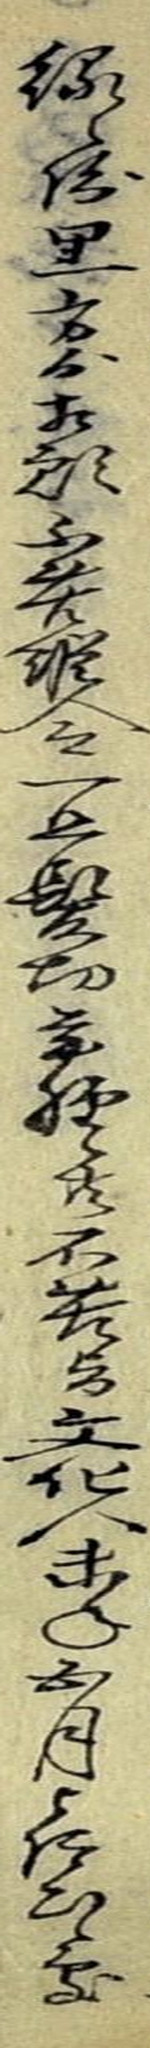縁之儀里方ゟ相願不苦縦令一旦髪切年経候共不苦旨文化八未年五月被仰出候処
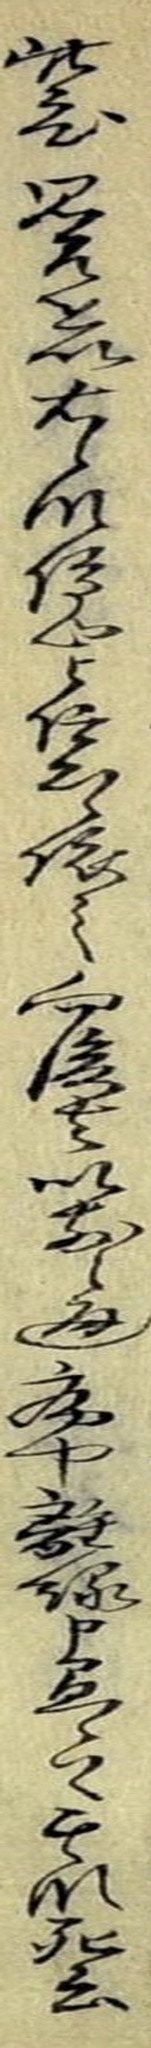此度思召を以右之段停止被仰出候依之向後は以前之通病中離縁申置候はヽ其段死去
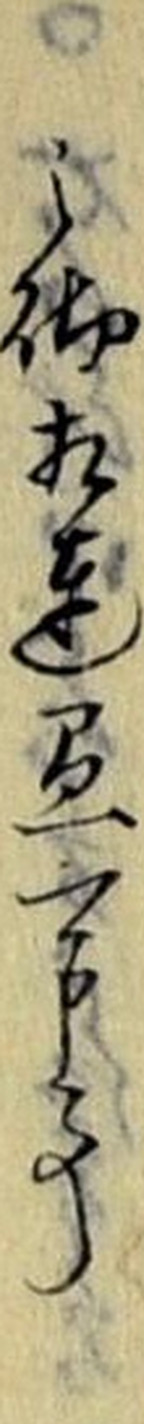之砌相達置可申事
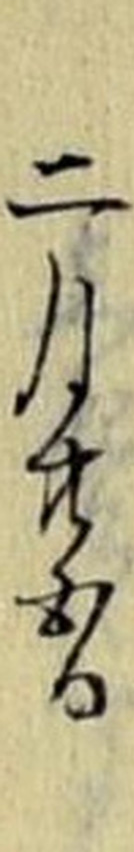二月廿五日
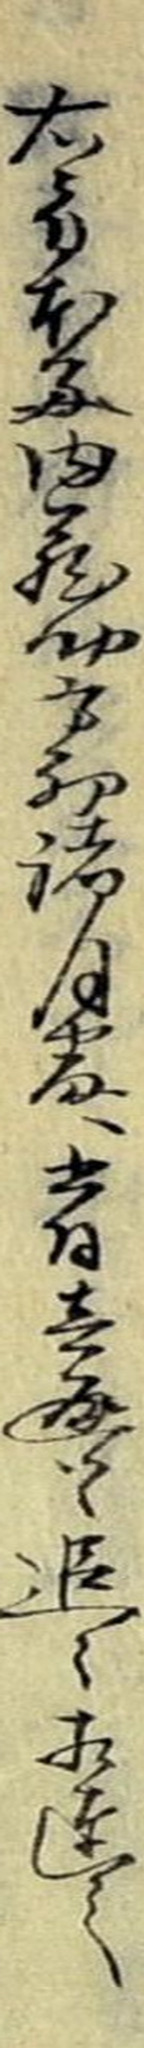右に付本多内蔵助方初諸月番へ書付壱通つヽ追々相達之
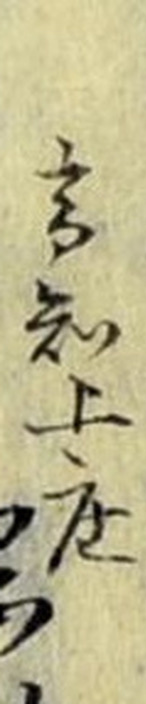高知上座
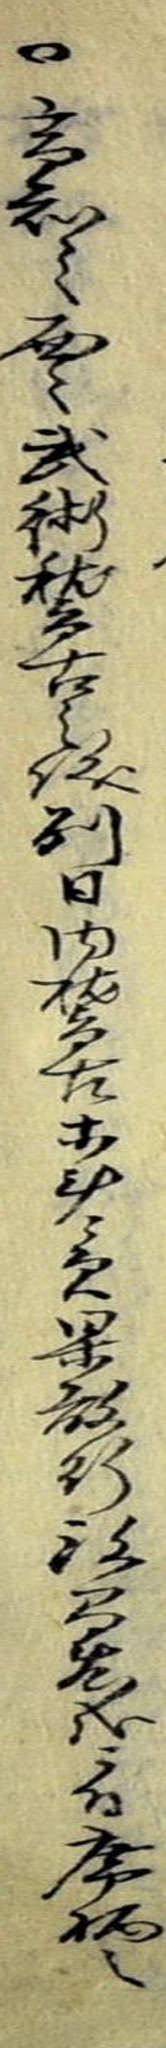○高知之面々武術稽古之儀別日内稽古等斗に而は果敢行致間敷哉に付席柄之
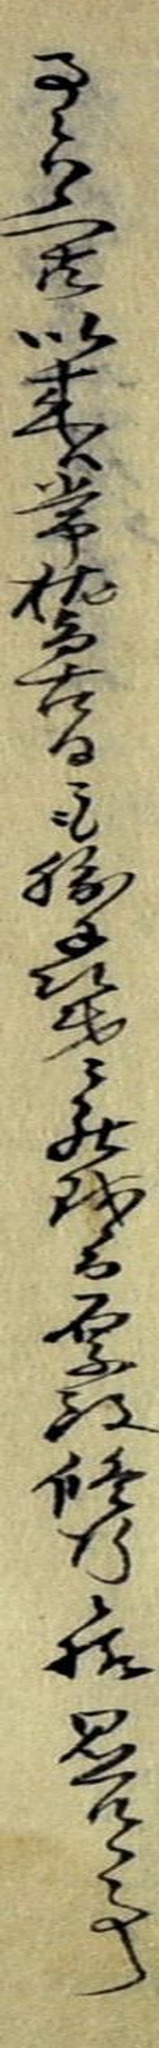事に候へ共以来は常稽古日にも勝手次第に罷越候而厚致修行候様思召候事

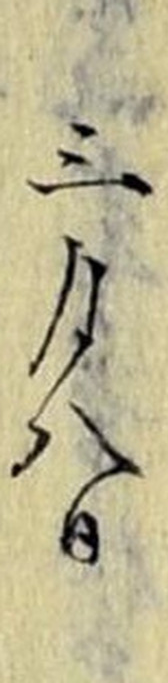三月八日
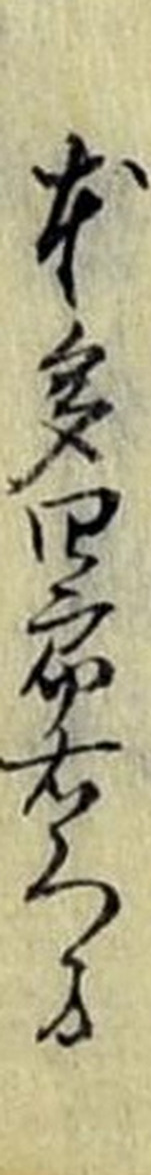本多四郎右衛門方
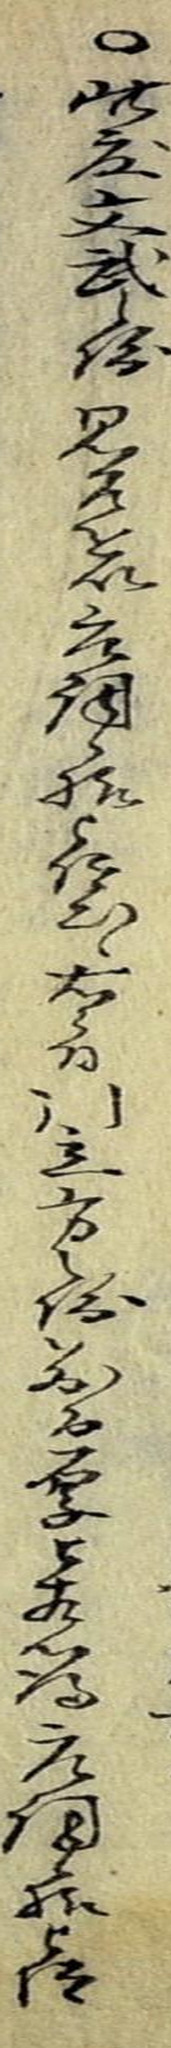○此度文武之儀思召を以取調候様被仰出候右に付引立方之儀別而厚被相心得取調候様被仰
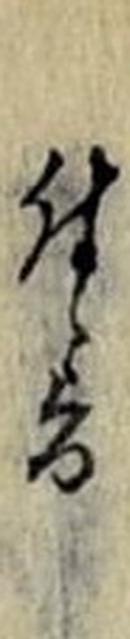付候旨
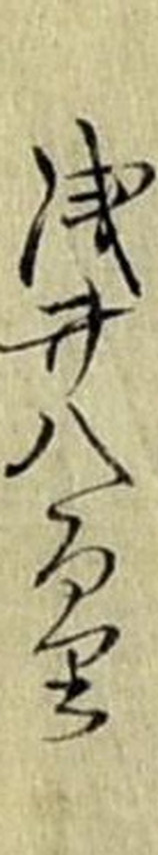浅井八百里
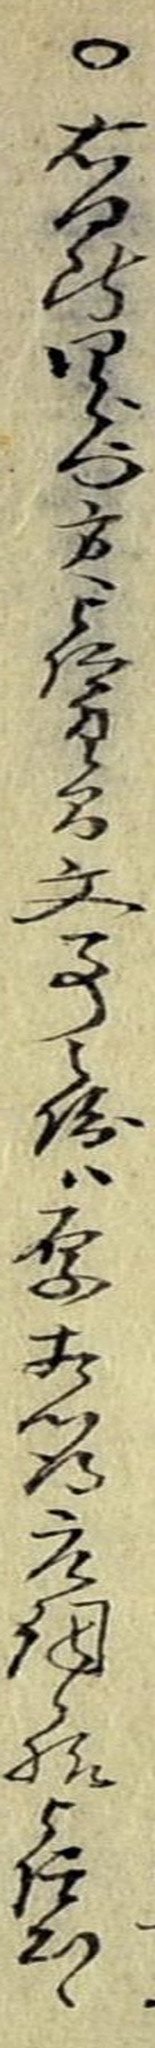○右同断四郎右衛門方へ被仰付候間文事之儀は厚相心得取調候様被仰出候
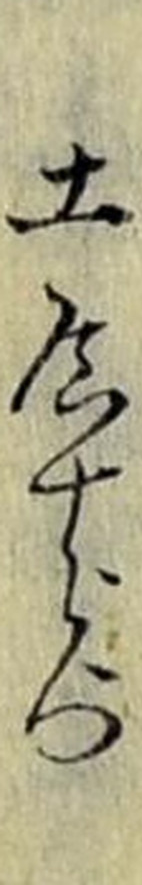土屋十郎右衛門
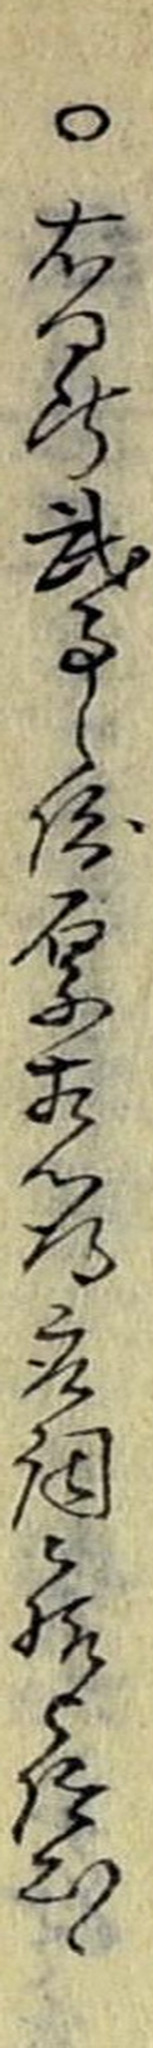○右同断武事之儀厚相心得取調候様被仰出候
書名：命令之部 六
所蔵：福井県文書館 Fukui Prefectural Archives
